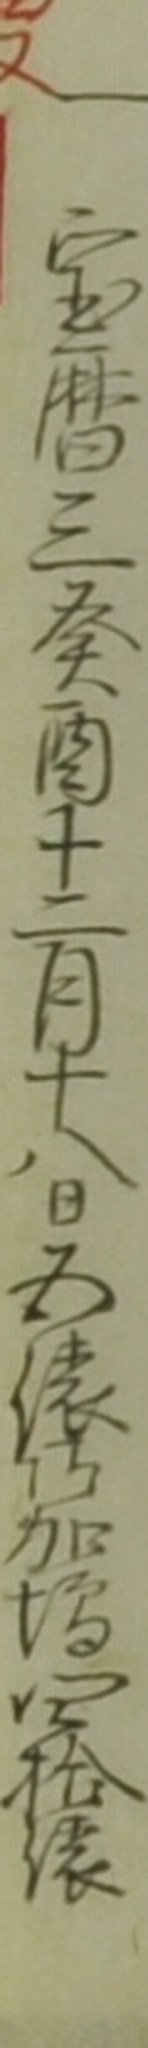一宝暦三癸酉十二月十八日五俵御加増四拾俵
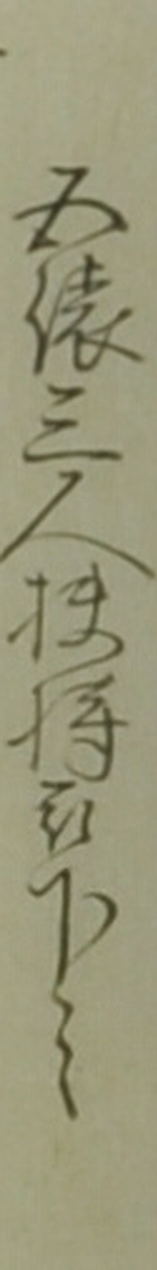五俵三人扶持被下之

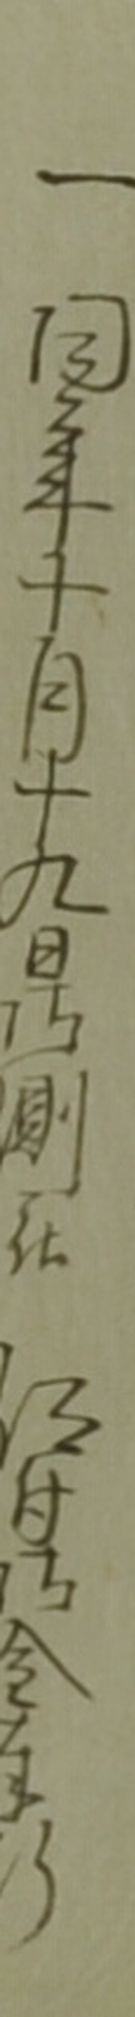一同年十月十九日御側被仰付御金奉行
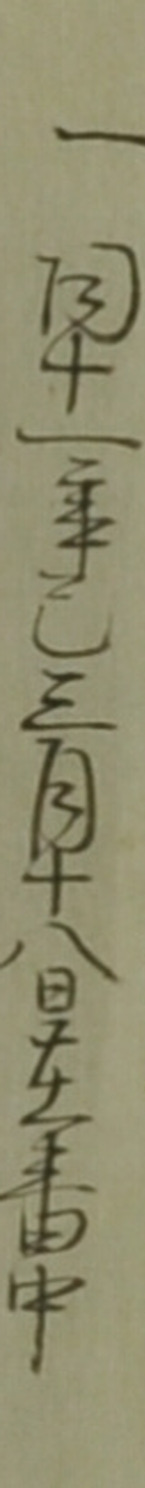一同十一辛巳三月十八日在番中
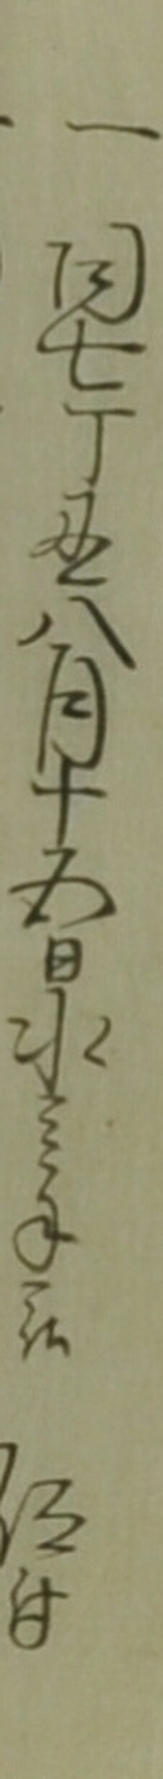一同七丁丑八月十五日水之手被仰付
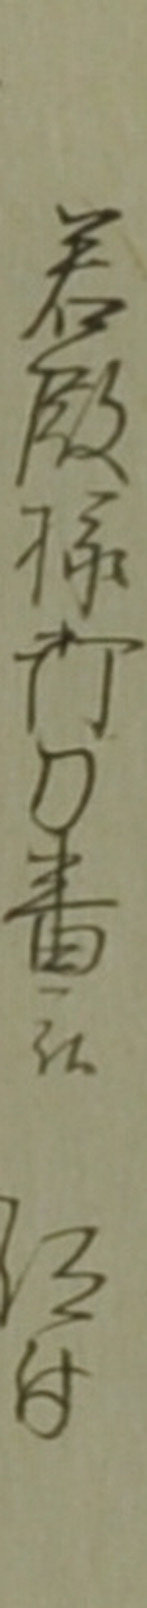若殿様御刀番被仰付
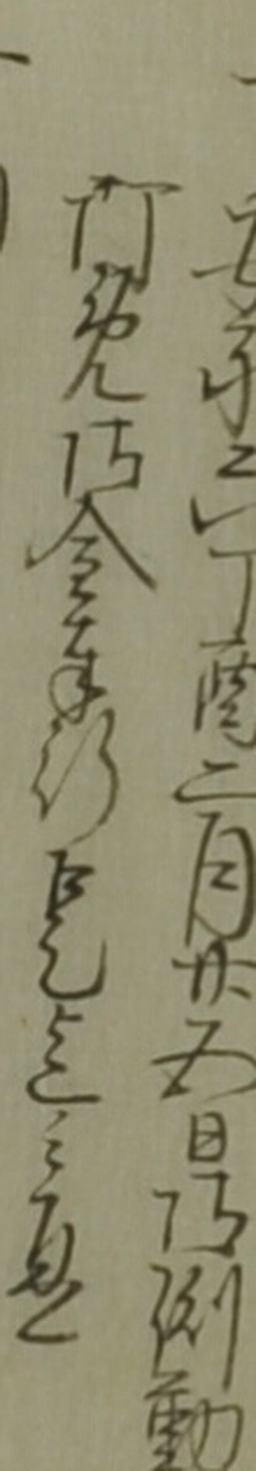御免御金奉行是迄之通
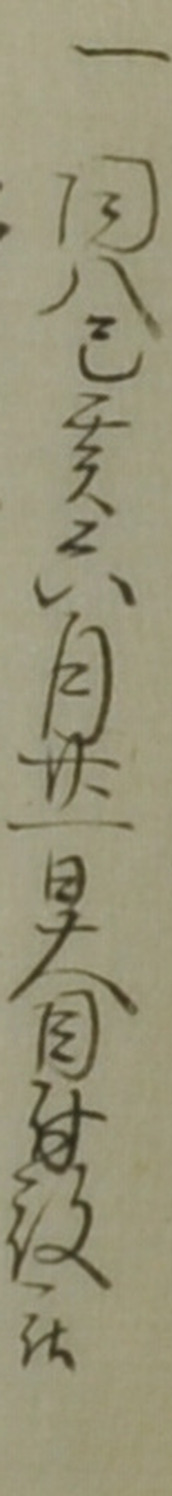一同八己亥六月廿一日大目付役被
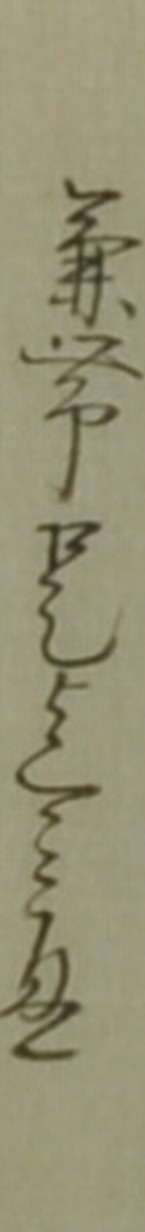兼帯是迄之通
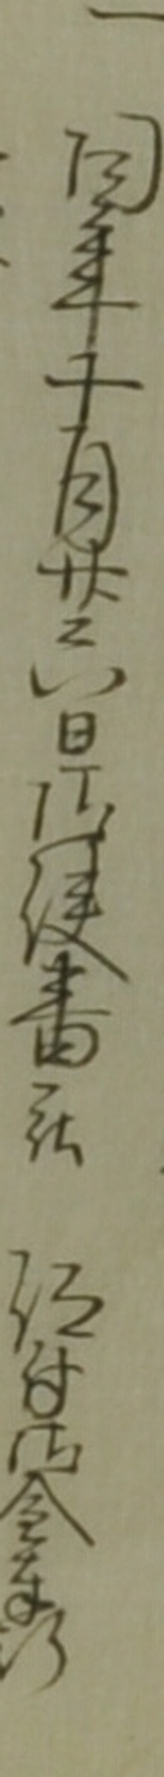一同年十月廿六日御使番被仰付御金奉行
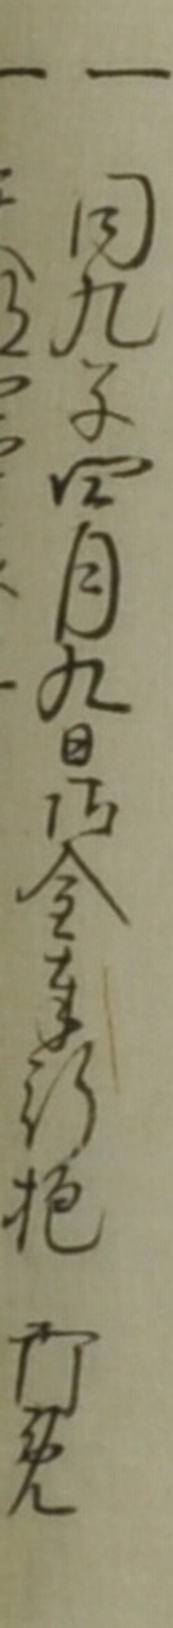一同九子四月九日御金奉行抱御免
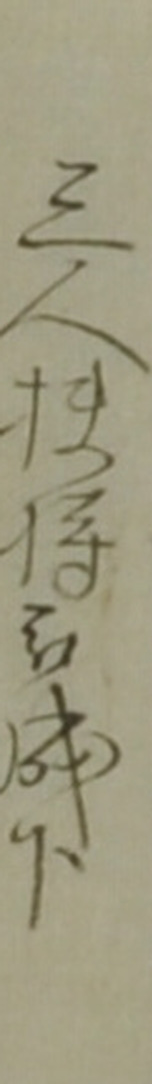三人扶持緋被成下
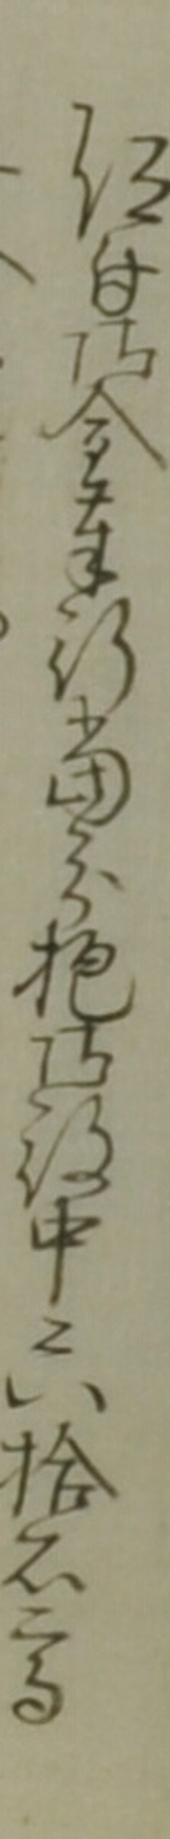仰付御金奉行当分抱御役中六拾石高
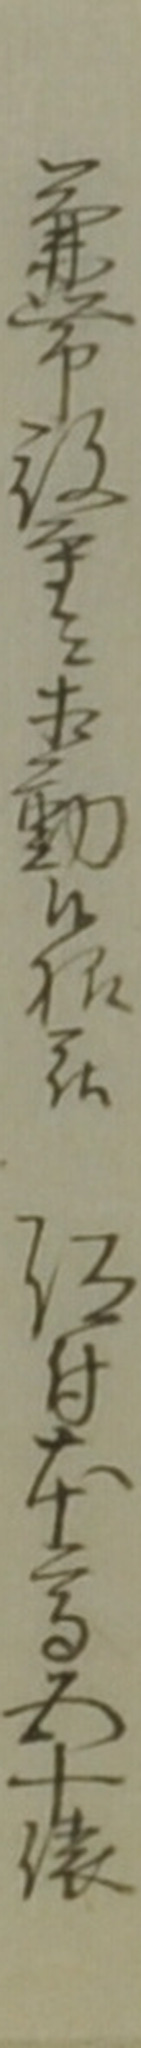兼帯役重ニ相勤候様被仰付本高五十俵
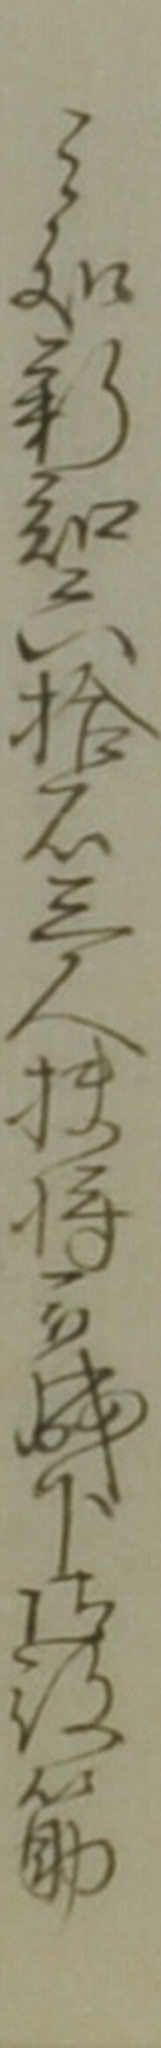之処新知六拾石三人扶持被成下御役筋
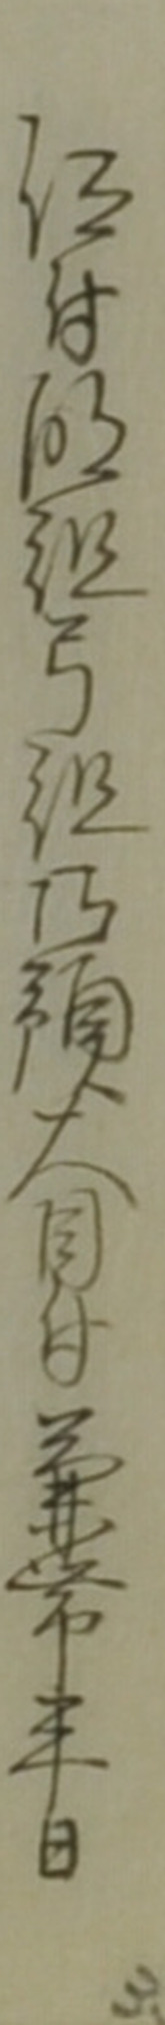仰付明組弓組御預大目付兼帯半日
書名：給人諸士勤仕録（三）
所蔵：伊那市立高遠町図書館・合同会社AMANE
